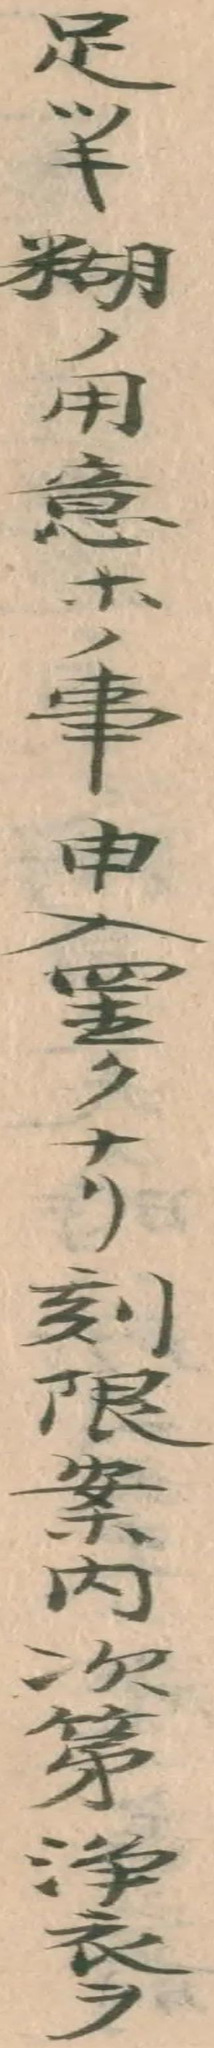足ツキ糊ノ用意等ノ事申入置クナリ刻限案内次第浄衣ヲ
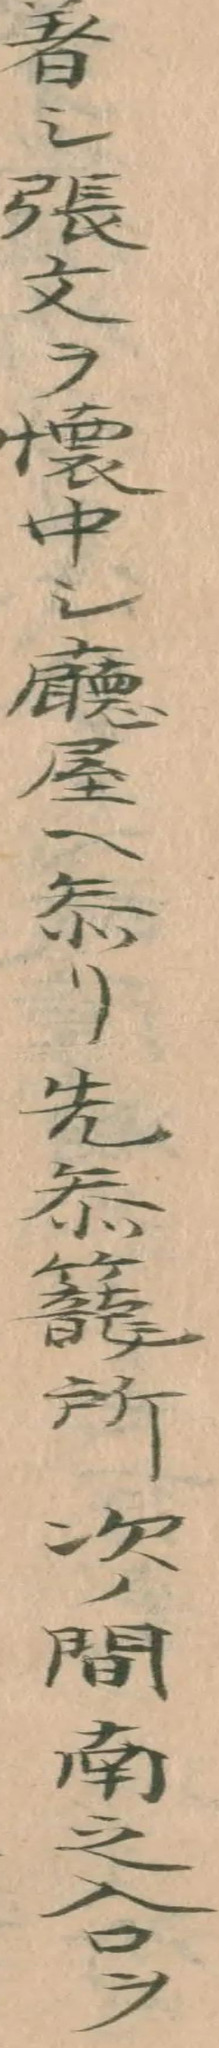着シ張文ヲ懐中シ廳屋へ参リ先参籠所次ノ間南之入口ヲ
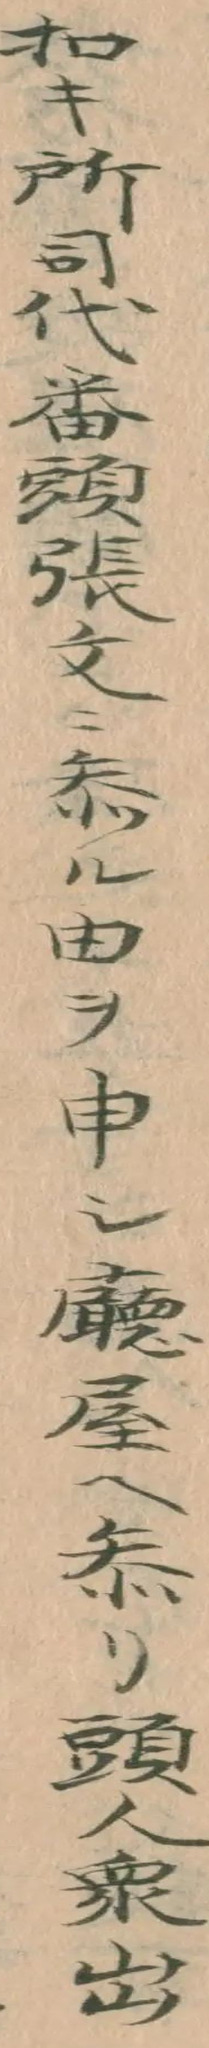扣キ所司代番頭張文ニ参ル由ヲ申シ廳屋ヘ参リ頭人衆出
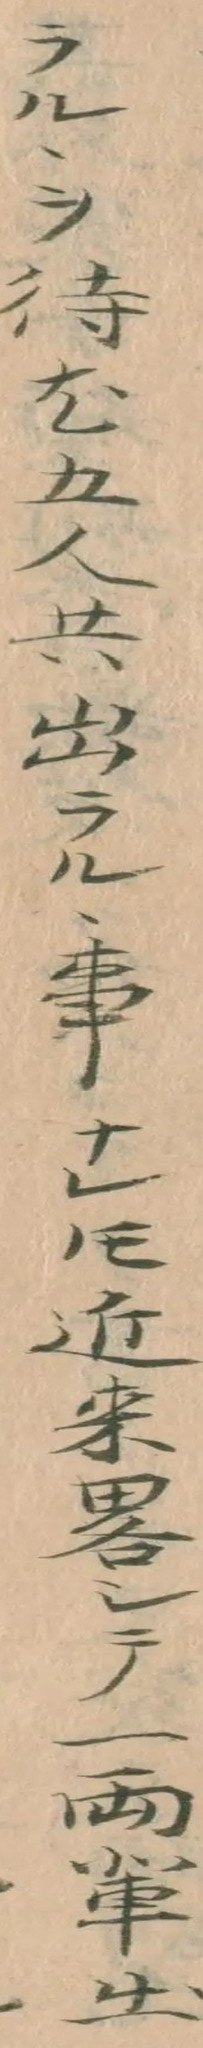ラルヽヲ待尤五人共出ラルゝ事ナレトモ近来畧シテ一両輩出
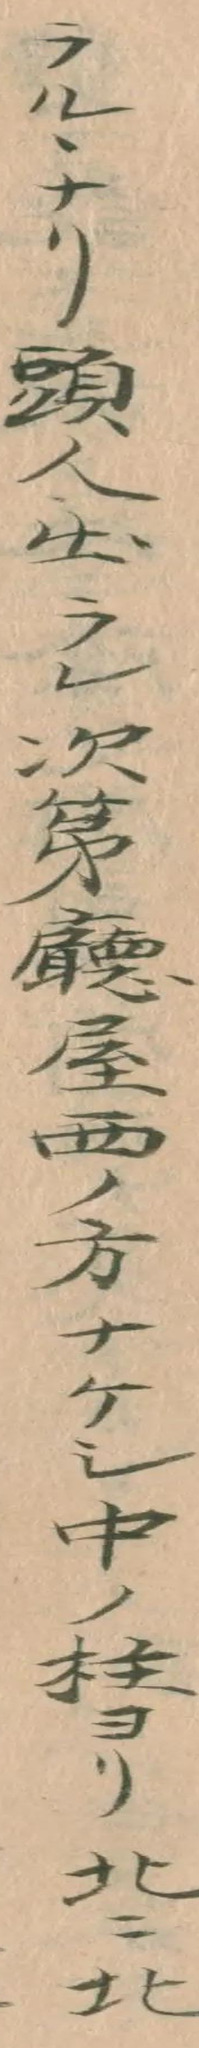ラルヽナリ頭人出ラレ次第廳屋西ノ方ナケシ中ノ柱ヨリ北ニ北
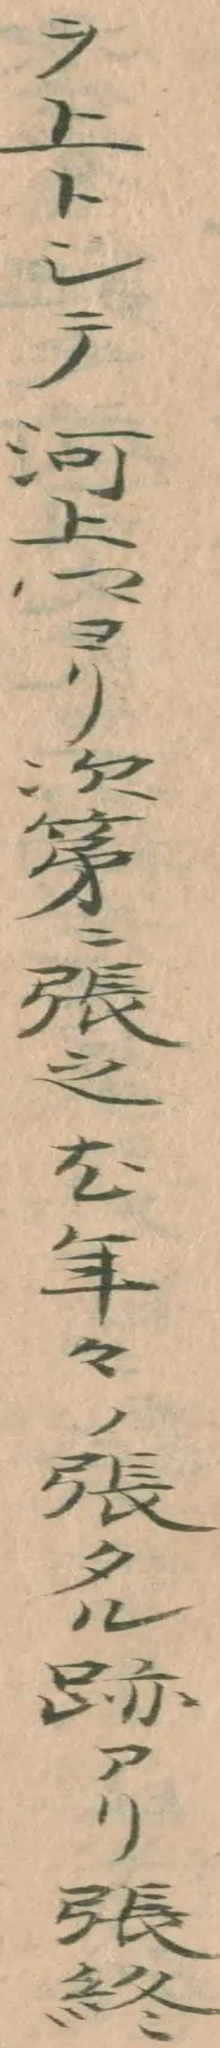ヲ上トシテ河上郷ヨリ次第ニ張之尤年々ノ張タル跡アリ張終
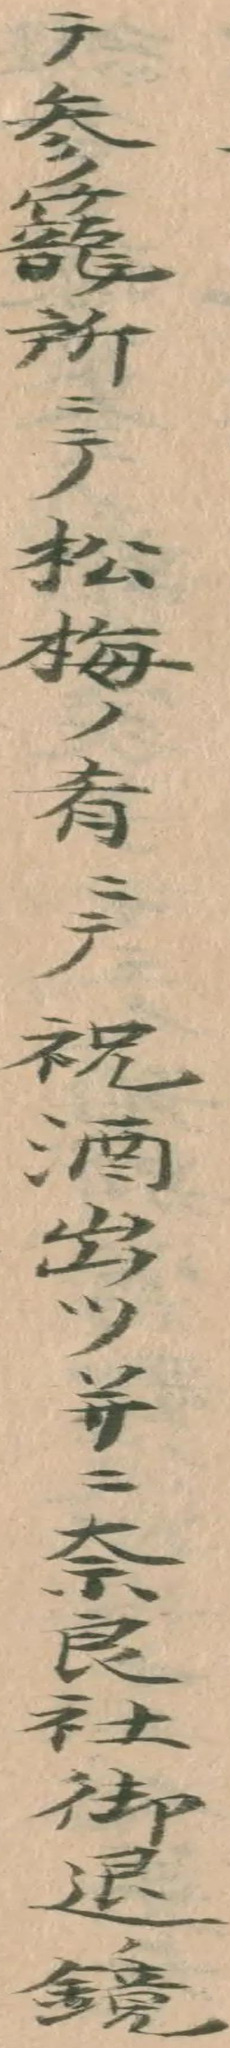テ参籠所ニテ松梅ノ肴ニテ祝酒出ツ幷ニ奈良社御退鏡
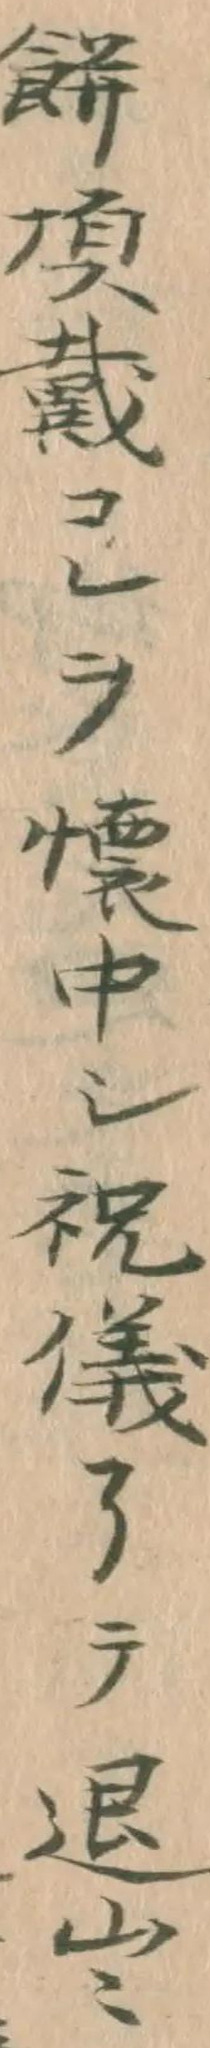餅頂戴コレヲ懐中シ祝儀了テ退出
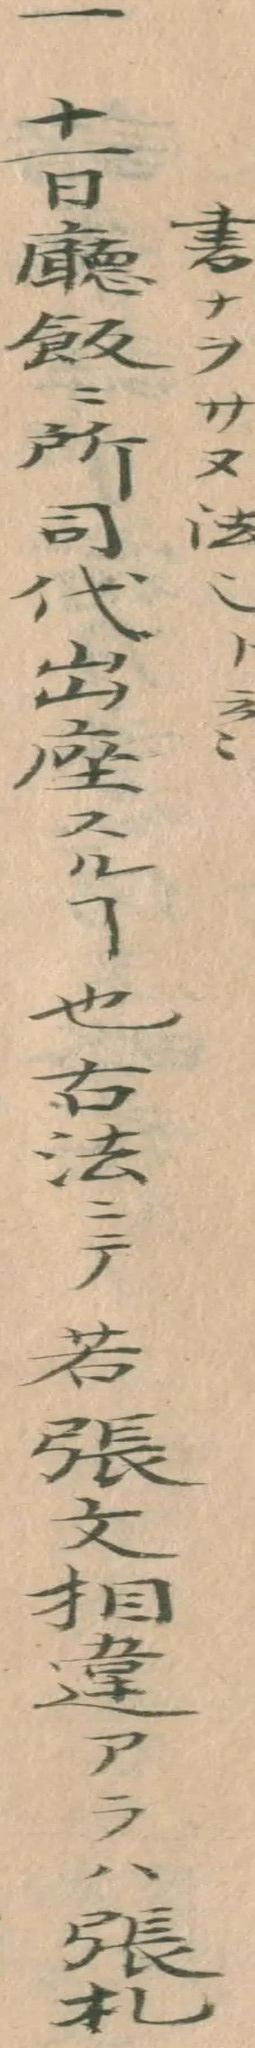十一日廳飯二所司代出座スルヿ也古法ニテ若張文相違アラハ張札
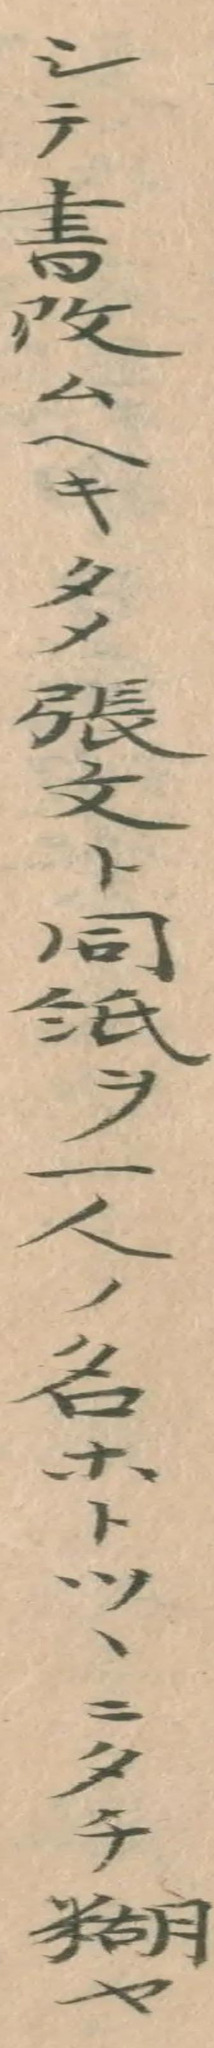シテ書改ムヘキタメ張文ト同紙ヲ一人ノ名ホトツヽニタチ糊ヤ
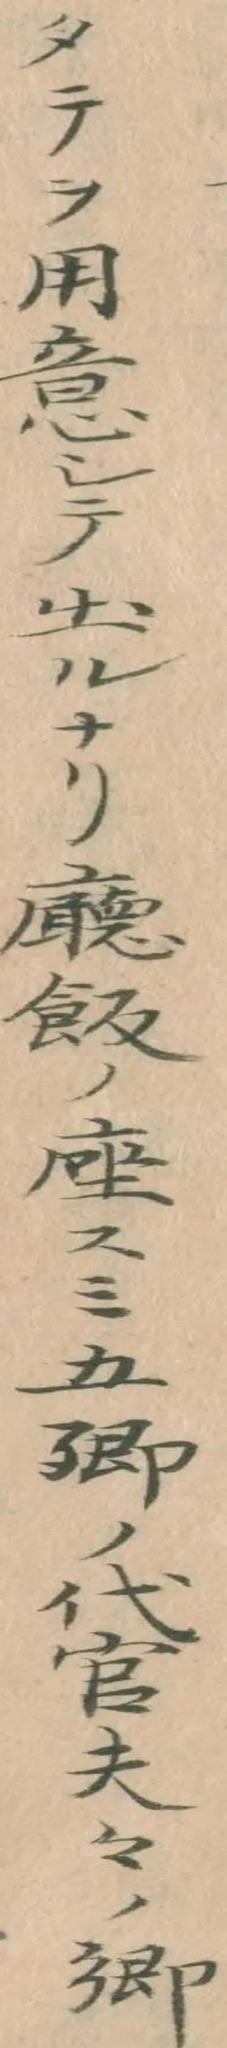タテヲ用意シテ出ルナリ廳飯ノ座スミ五郷ノ代官夫々ノ郷
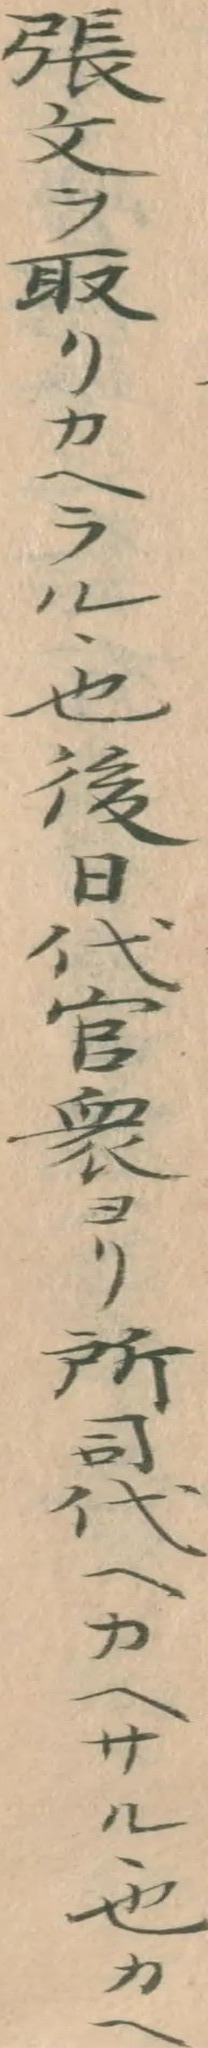張文ヲ取リカヘラルヽ也後日代官衆ヨリ所司代ヘカヘサルヽ也カヘ

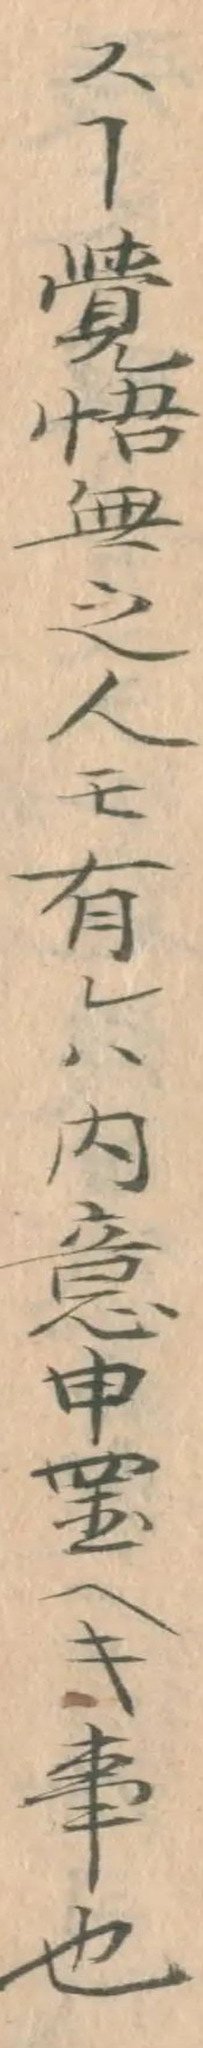スヿ覚悟無之人モ有レハ内意申置ヘキ事也
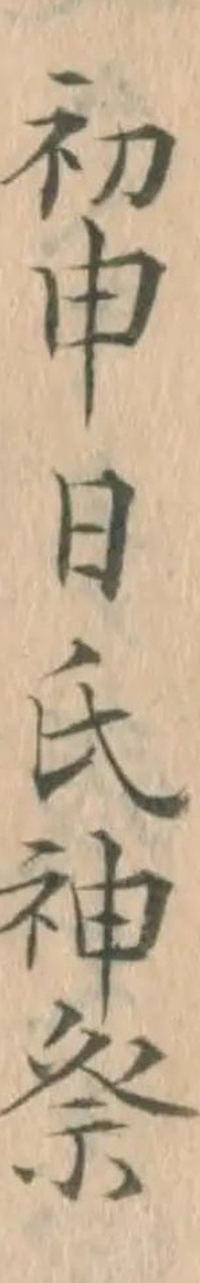初申日氏神祭
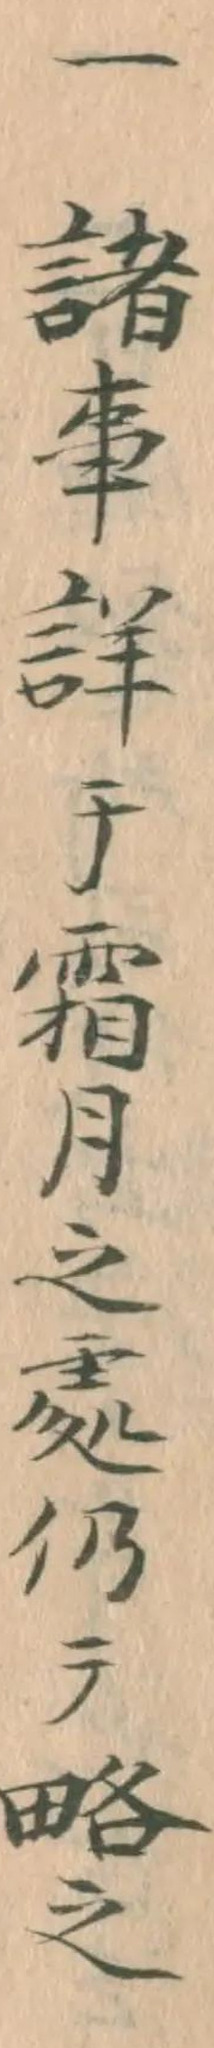一諸事詳于霜月之處仍テ略之
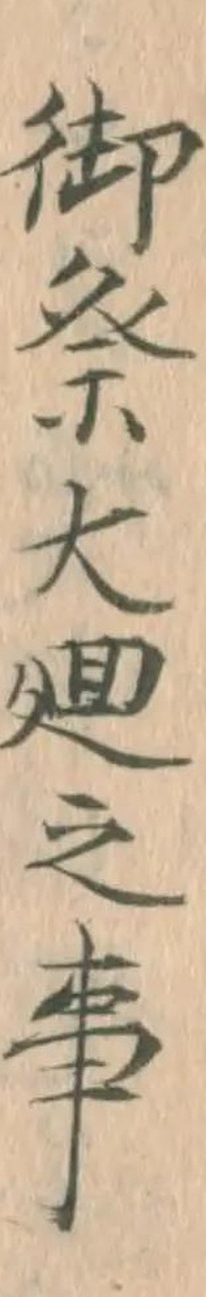御祭大廻之事
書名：賀茂社記録. 第40冊
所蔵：国立国会図書館 National Diet Library, JAPAN
